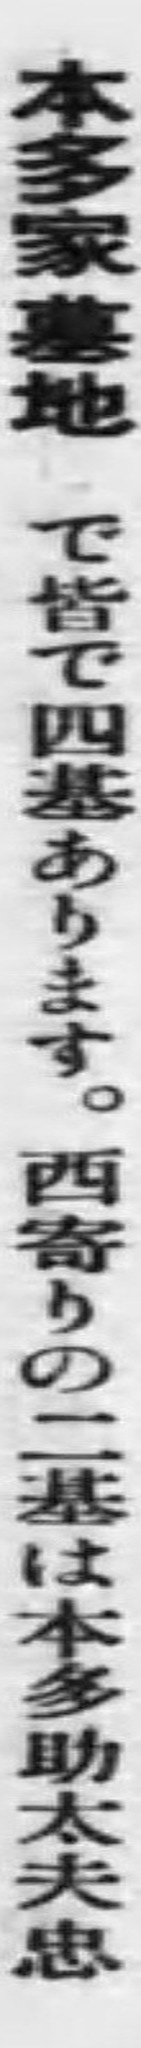本多家墓地で皆で四基あります。西寄りの二基は本多助太夫忠
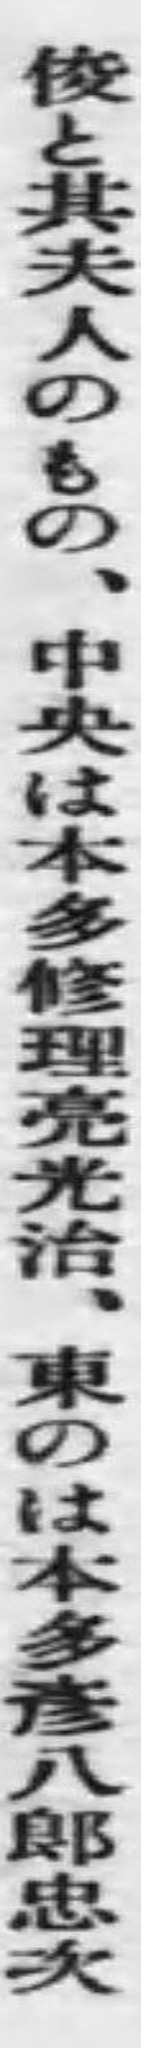俊と其夫人のもの、中央は本多修理亮光治、東のは本多彦八郎忠次
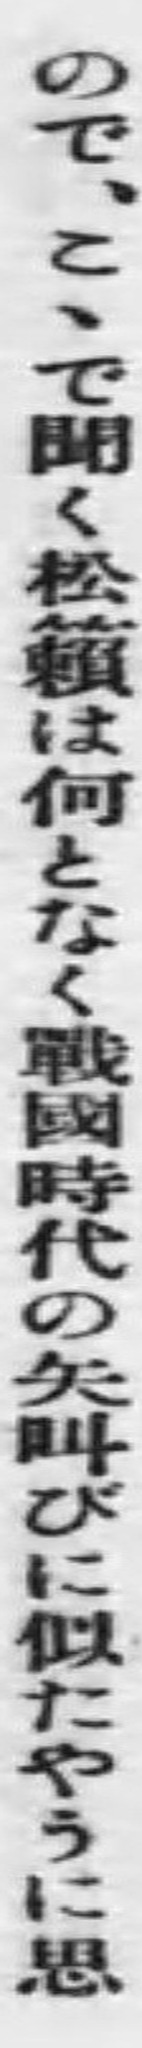ので、こゝで聞く松籟は何となく戦国時代の矢叫びに似たやうに思
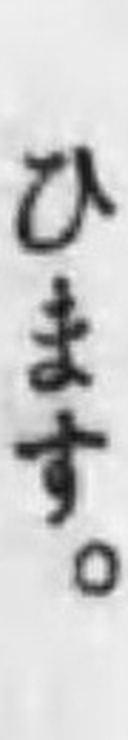ひます。
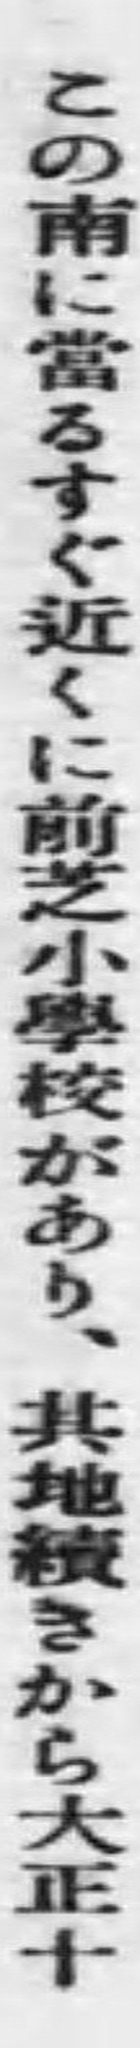この南に当るすぐ近くに前芝小学校があり、其地続きから大正十
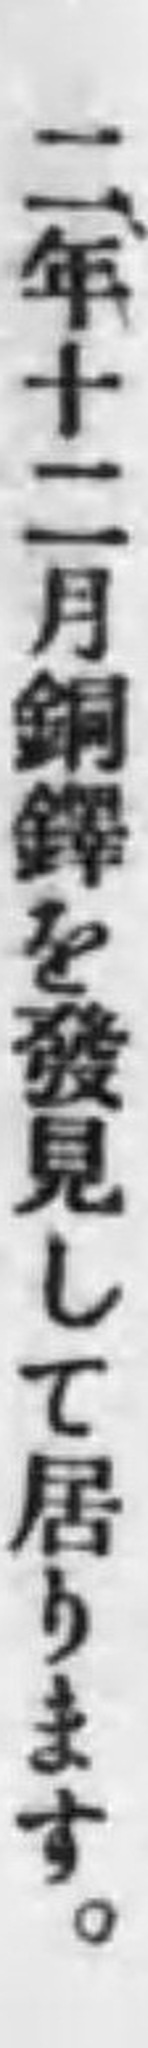二年十二月銅鐸を発見して居ります。
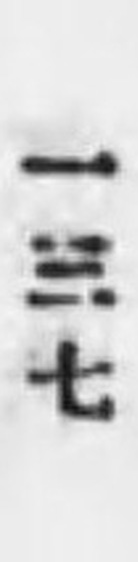一三七

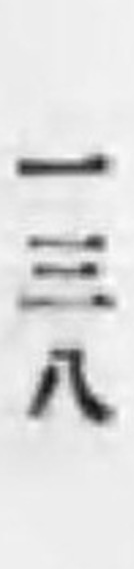一三八
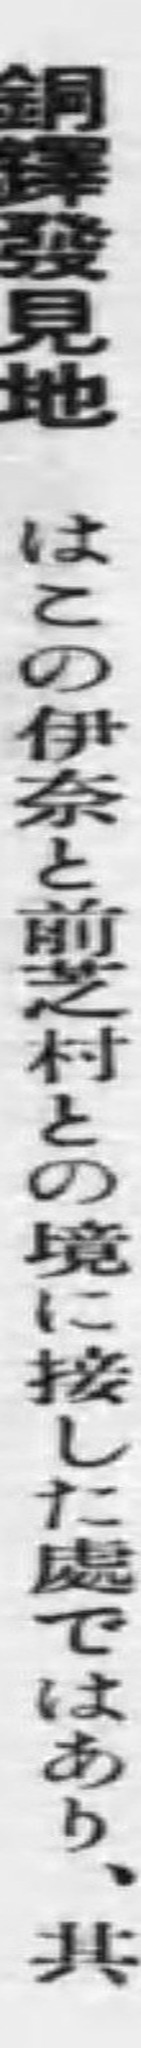銅鐸発見地はこの伊奈と前芝村との境に接した処ではあり、其
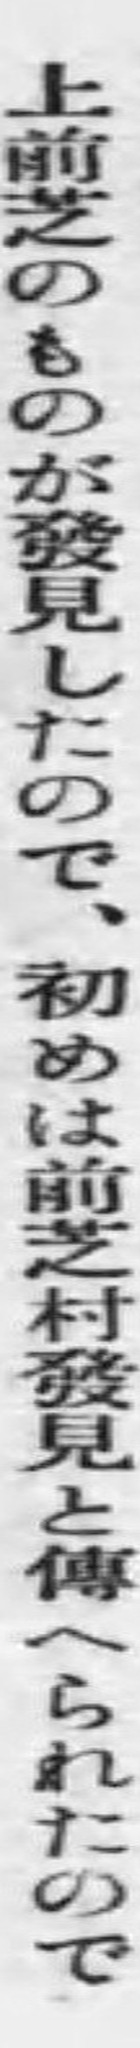上前芝のものが発見したので、初めは前芝村発見と伝へられたので
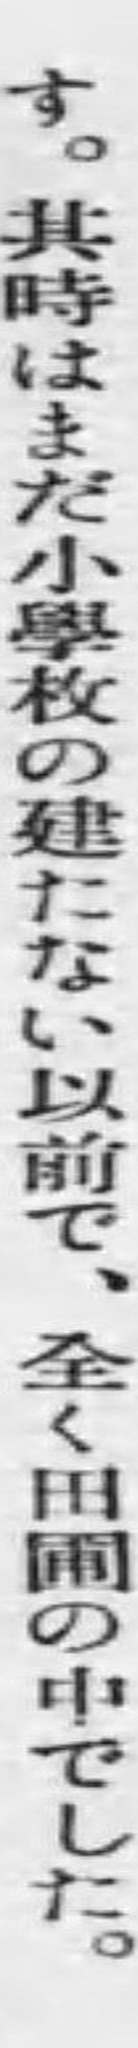す。其時はまだ小学枚の建たない以前で、全く田圃の中でした。
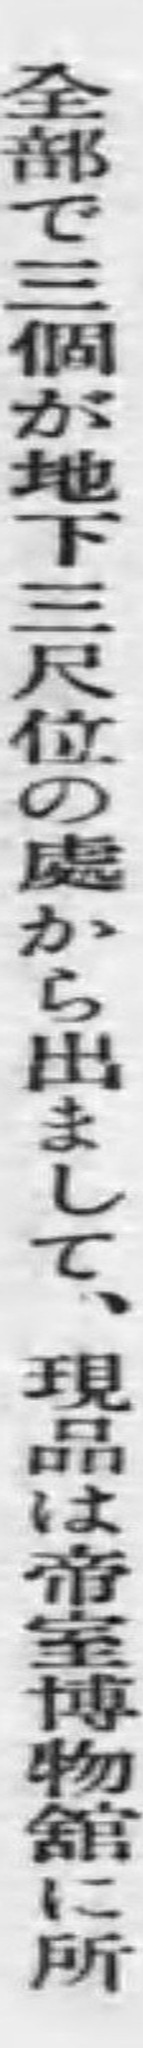全部で三個が地下三尺位の処から出まして、現品は帝室博物館に所
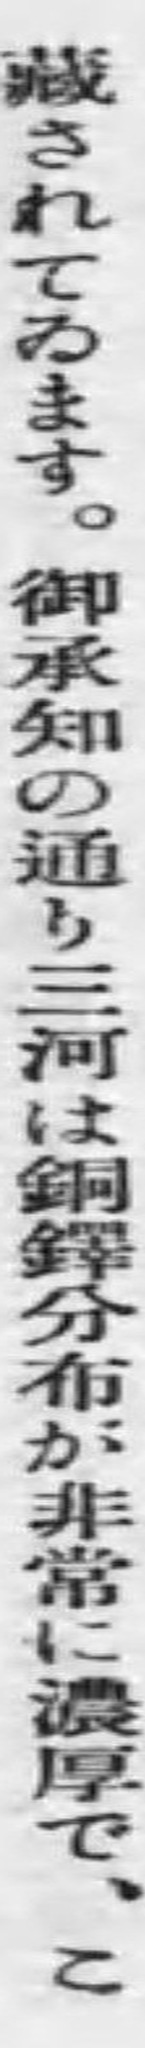蔵されてゐます。御承知の通り三河は銅鐸分布が非常に濃厚で、こ
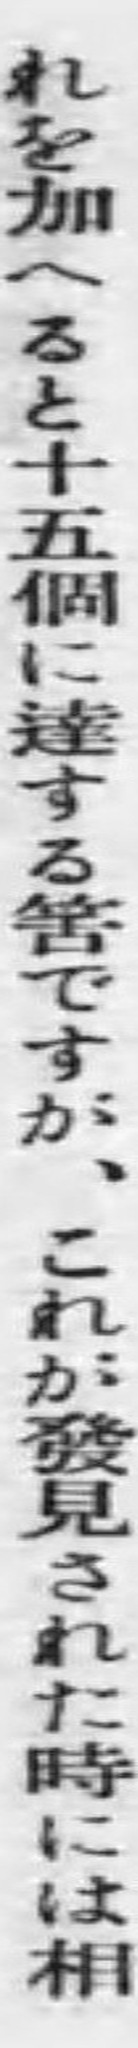れを加へると十五個に達する筈ですが、これが発見された時には相
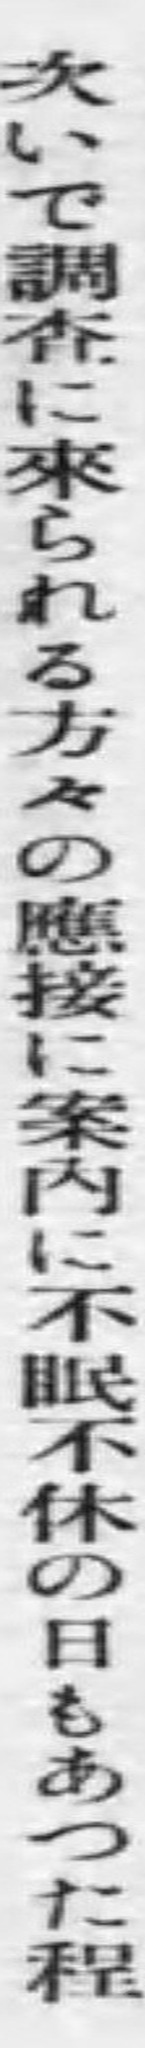次いで調査に来られる方々の応接に案内に不眠不休の日もあつた程
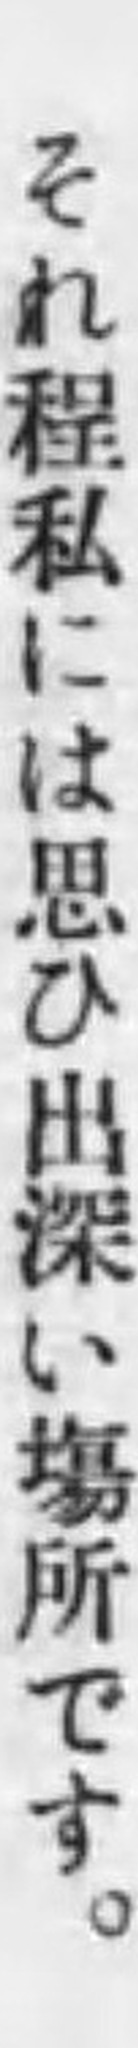それ程私には思ひ出深い場所です。
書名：東三河道中記 : 豊橋市及其附近案内
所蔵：国立国会図書館 National Diet Library, JAPAN
